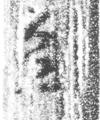○（錦）
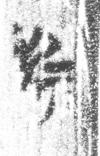○（裾）
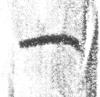一
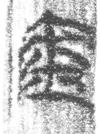○（錦）
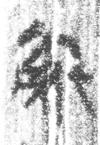終
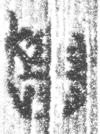○（枕）
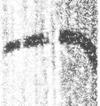一
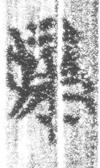○（寢）
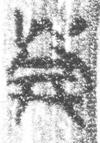○（莞）
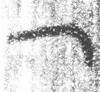一
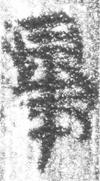○（寢）
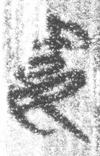○（筵）
